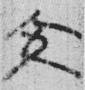交
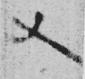又（有）
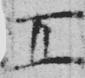工（功）
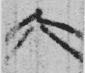六
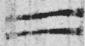二
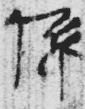係
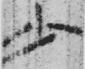少（小）
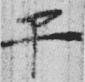子
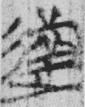○（失）
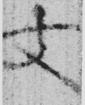丈
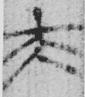夫
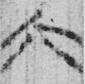六
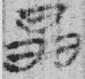晶
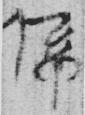係
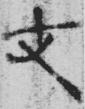丈
